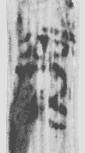爾
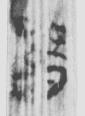{竹亯}
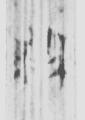{冉廿}
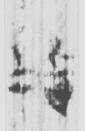{土旨}
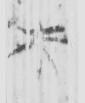夫
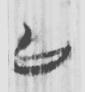㠯（以）
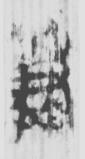兼
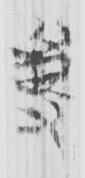尃
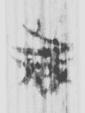者
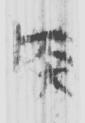侯
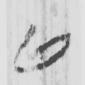㠯（以）
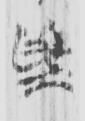爲
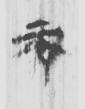天
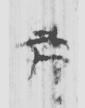下
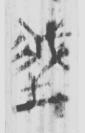{我土}
